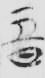○（期）
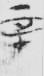辛
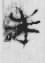未
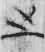之
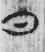日
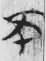不
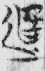𬨭（將）
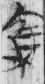○（集）
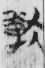獸
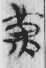黃
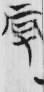辱
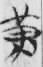黃
